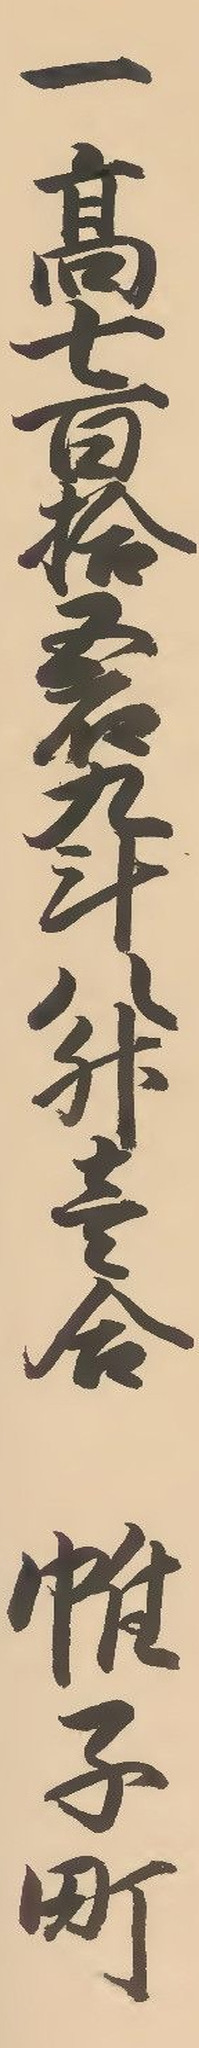一高七百拾五石九斗八升壱合帷子町
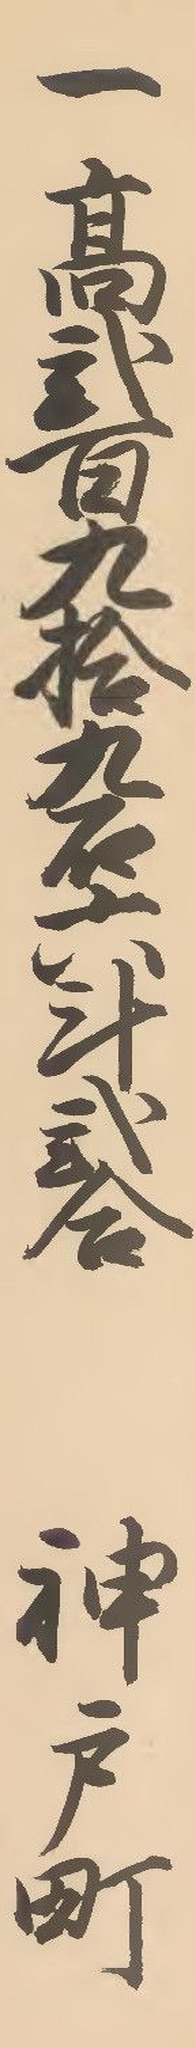一高弐百九拾九石六斗弐合神戸町
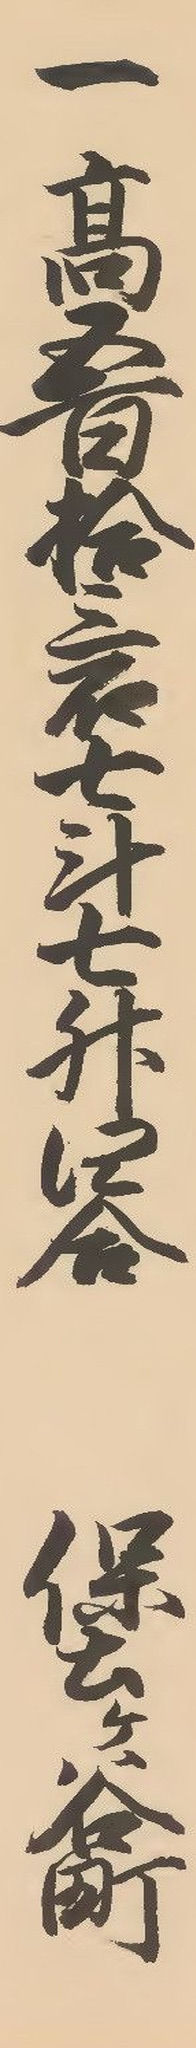一高五百拾三石七斗七升四合保土ヶ谷町
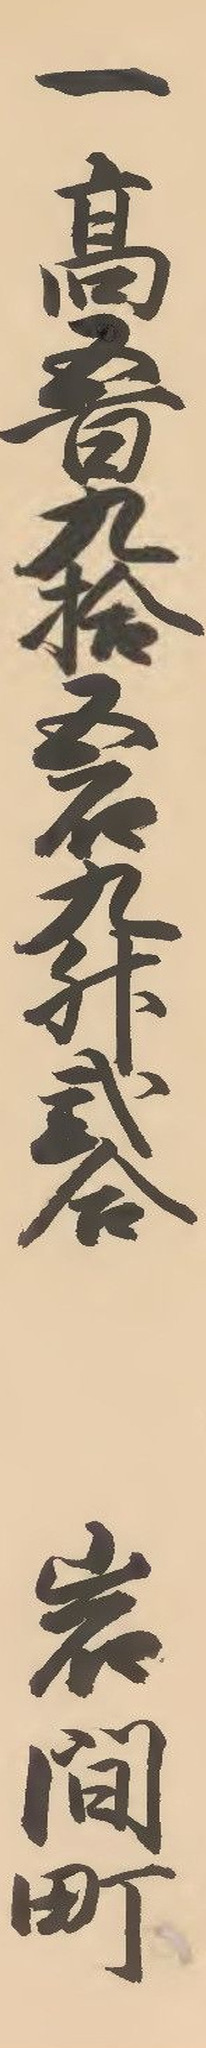一高五百九拾五石九升弐合岩間町
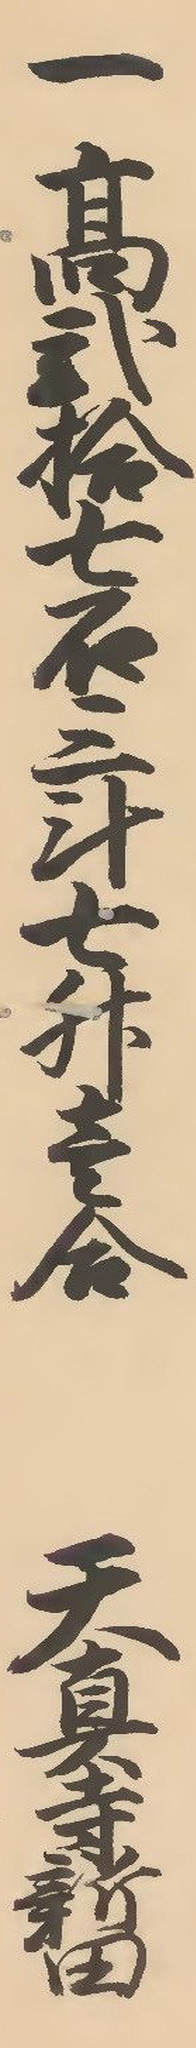一高弐拾七石三斗七升壱合天真寺新田

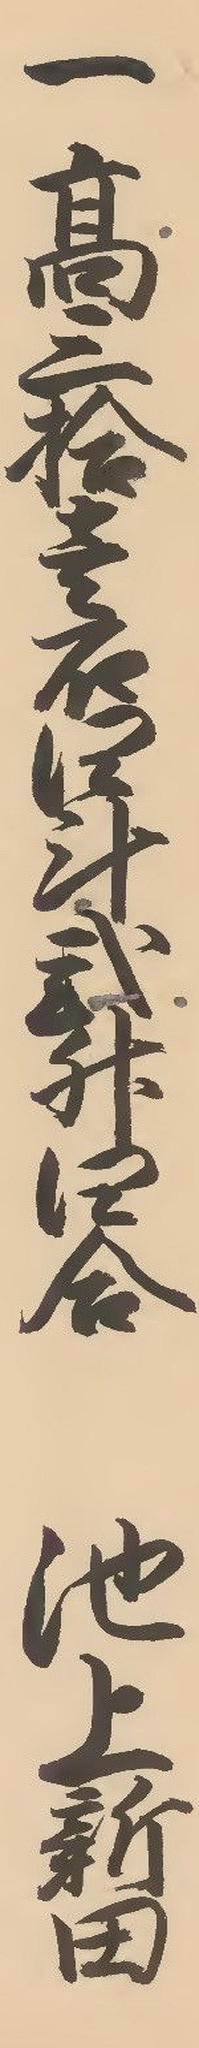一高三拾壱石四斗弐升四合池上新田
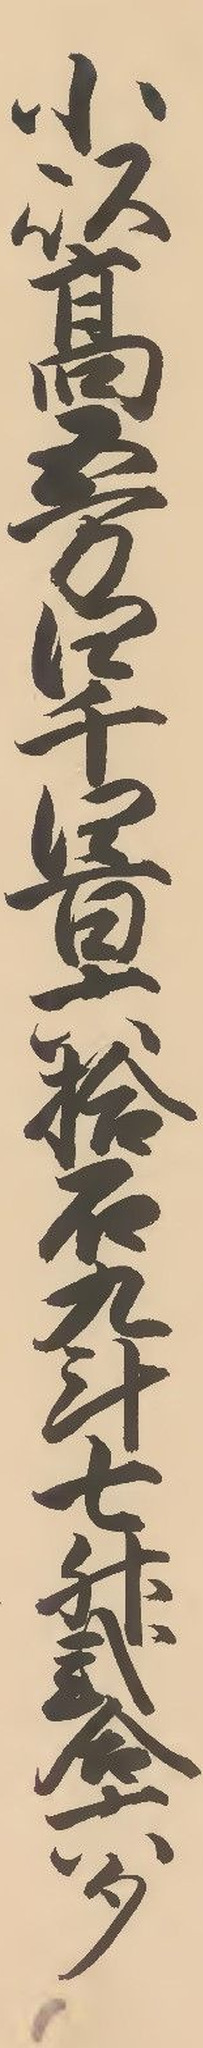小以高五万四千四百六拾石九斗七升弐合六勺
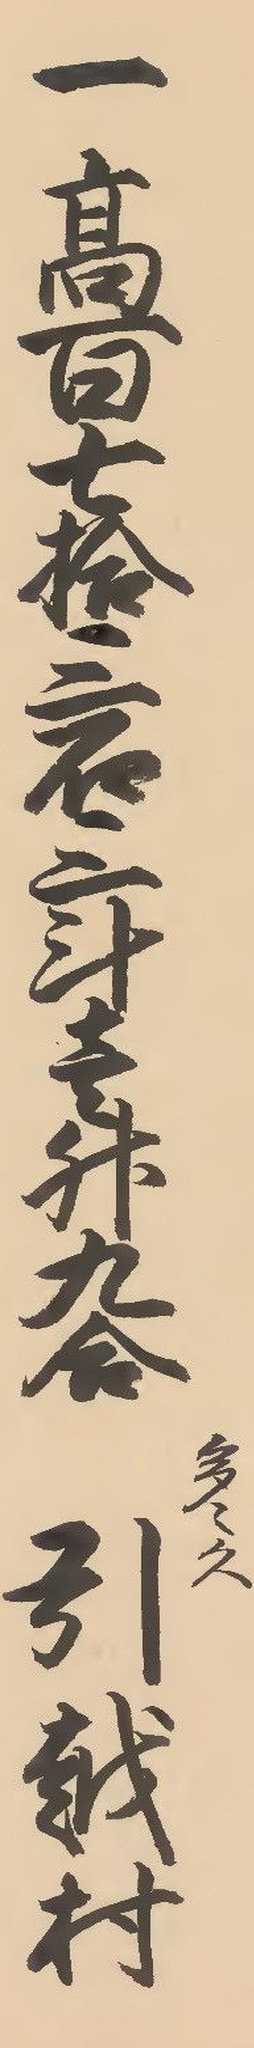一高百七拾三石三斗壱升九合引越村
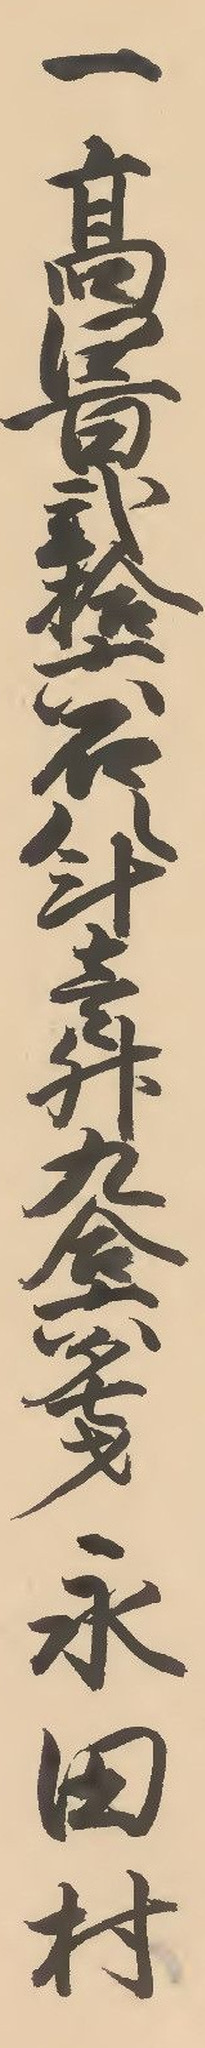一高四百弐拾六石八斗壱升九合六勺七才永田村
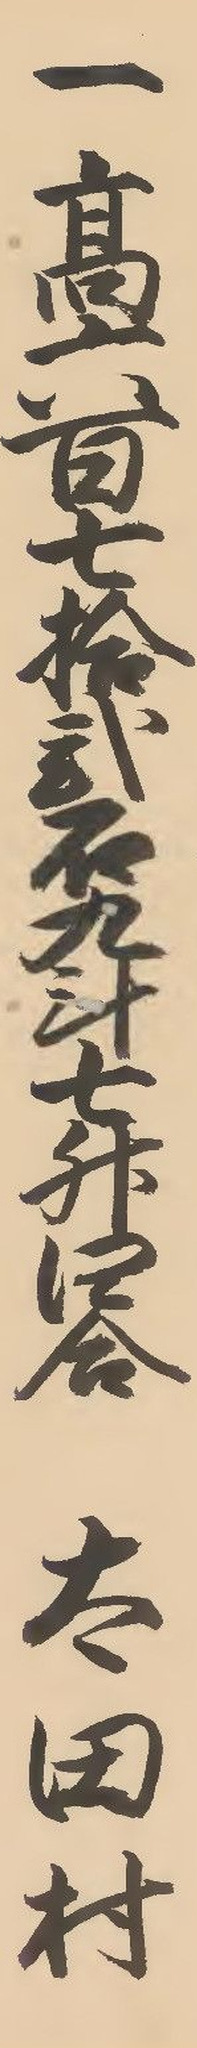一高六百七拾弐石九斗七升四合太田村

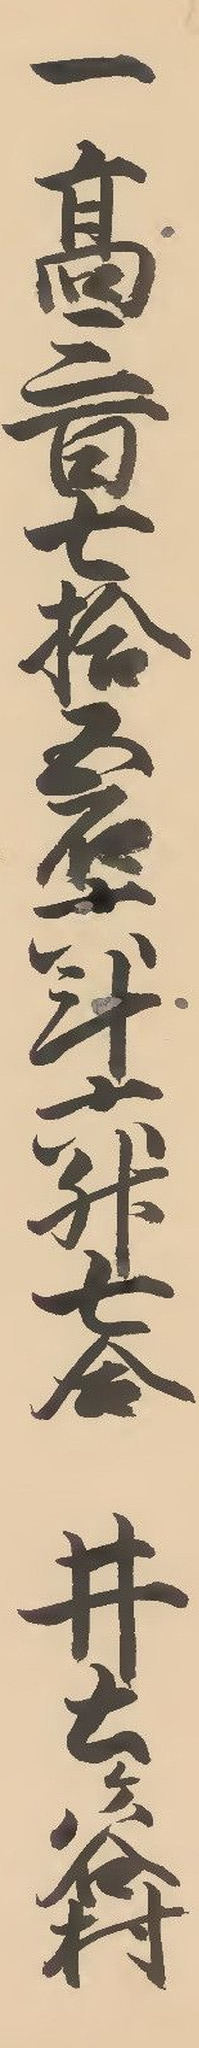一高三百七拾五石六斗六升七合井土ヶ谷村
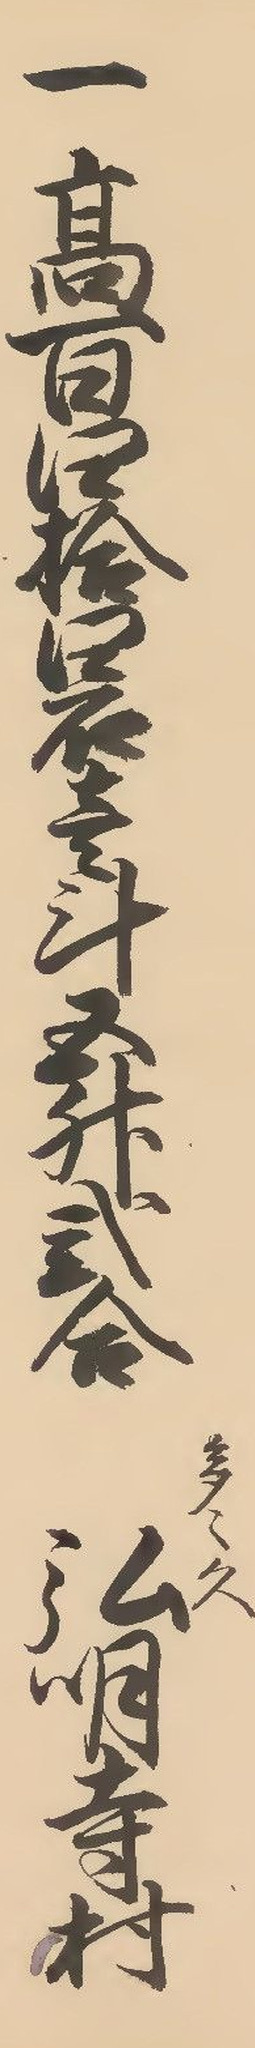一高百四拾四石壱斗五升弐合弘明寺村
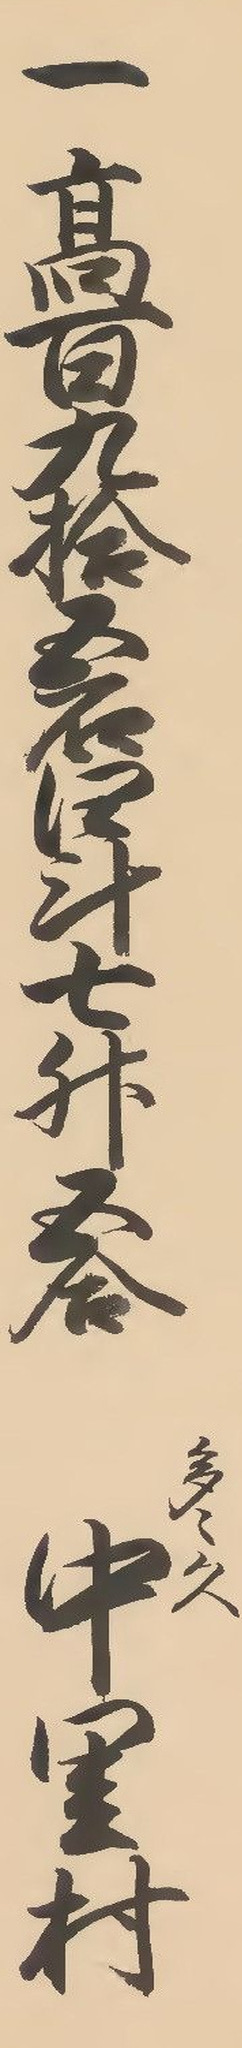一高百九拾五石四斗七升五合中里村
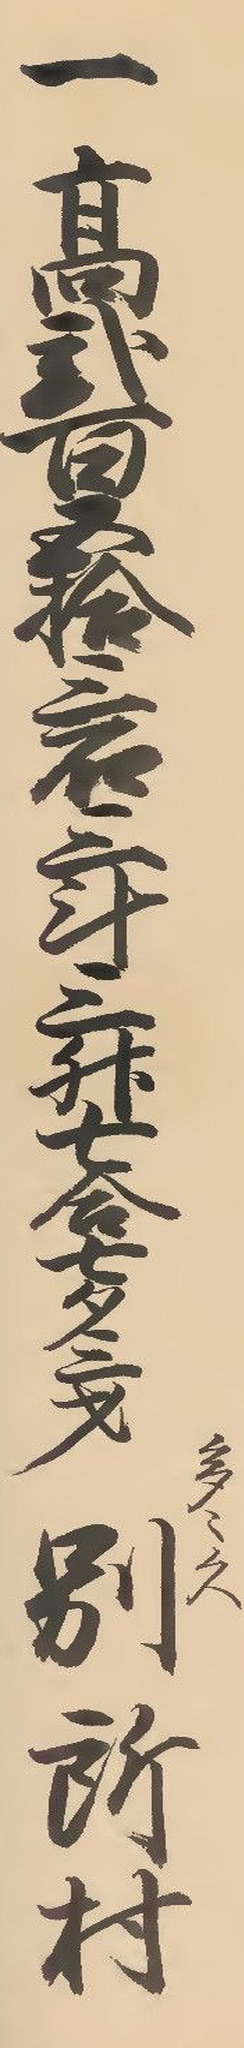一高弐百五拾三石三斗三升七合七タ三才別所村
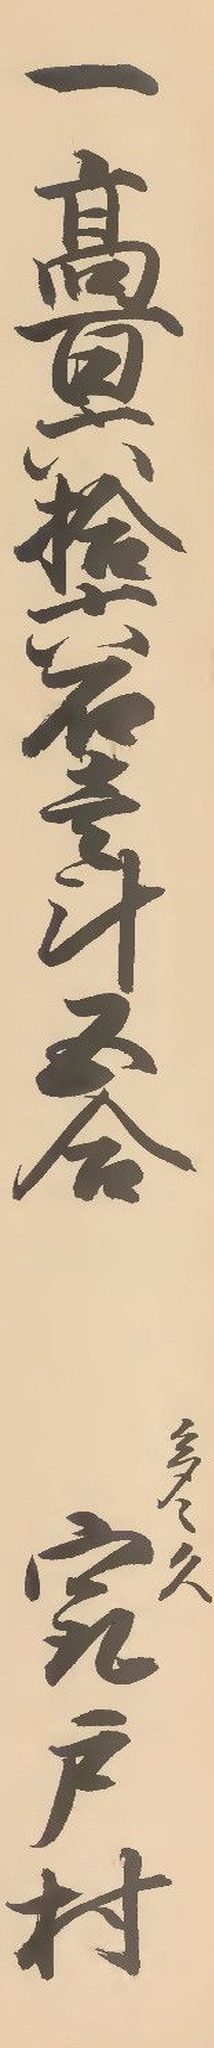一高百六拾六石壱斗五合㝡戸村
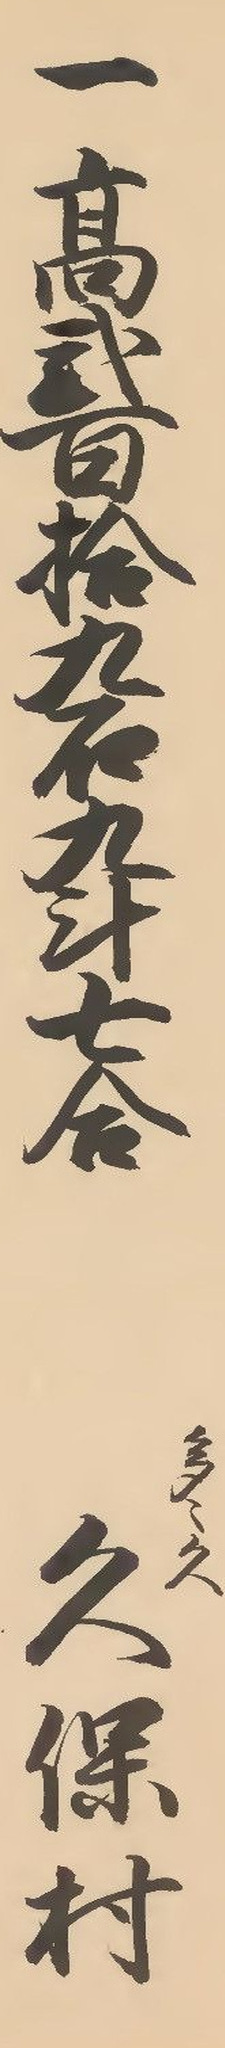一高弐百拾九石九斗七合久保村
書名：武蔵国郷帳　上
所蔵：国立公文書館 National Archives of Japan
